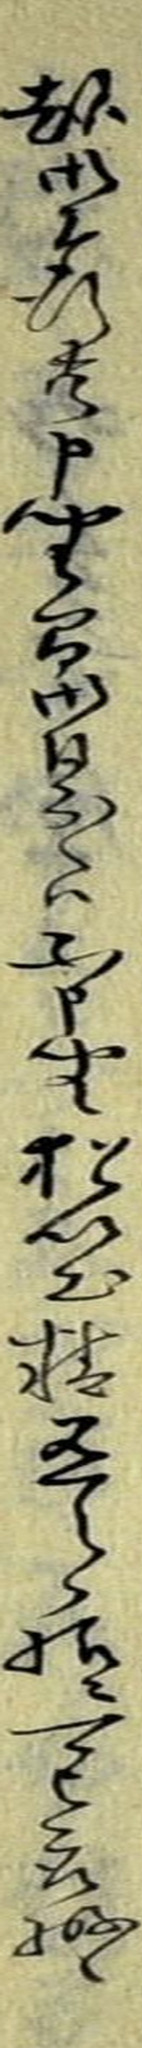趣御奉行共へ申聞候間御自分へは不申聞候猶以出精有之候様に可被取扱候
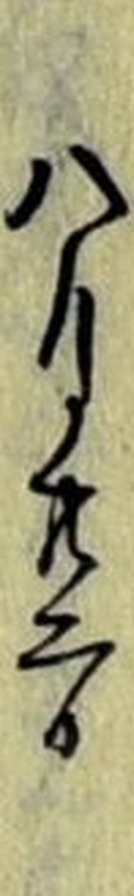八月廿二日
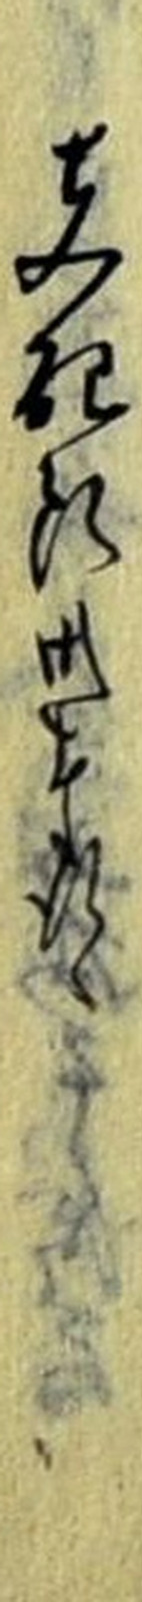支配頭御奉行へ

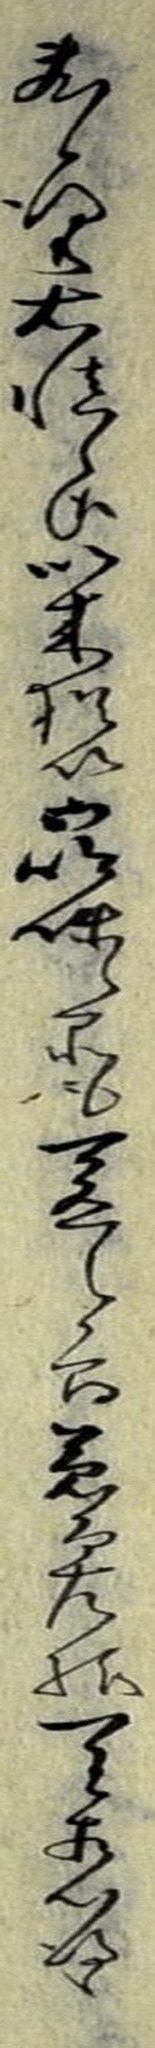敷候得共右慎候趣以来猶以御吟味之品も可有之候間兼而左様可被相心得候
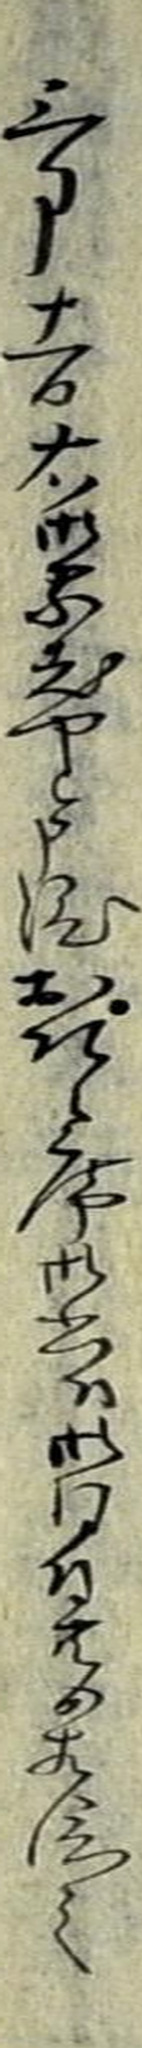三月十一日右御家老中被申渡於次之席御書付御目付共ゟ相渡之
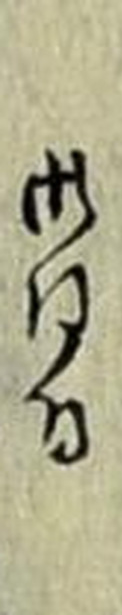御目付
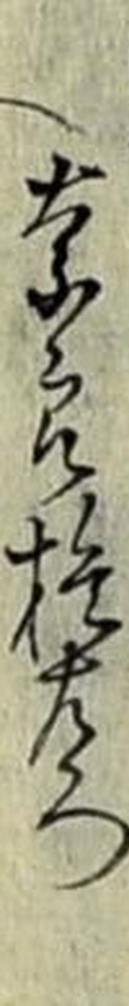奈良権左衛門
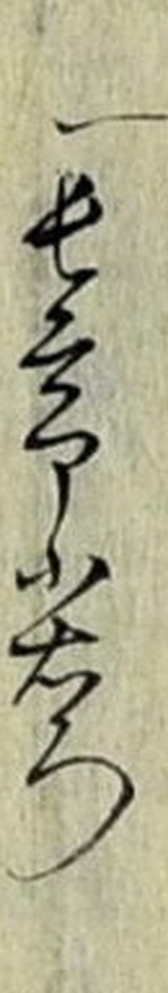長谷部小右衛門
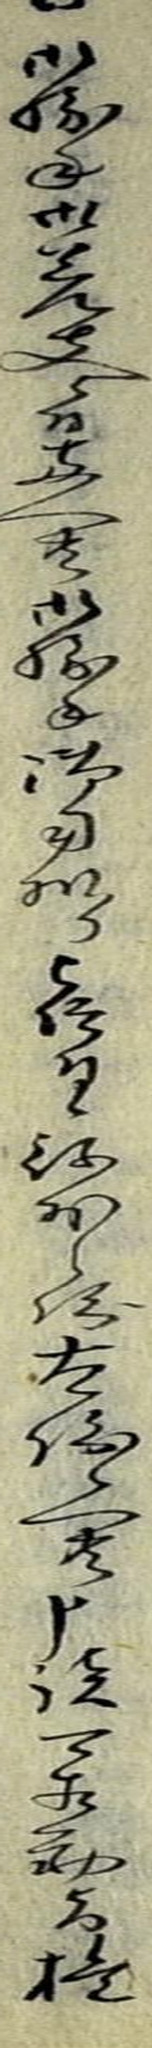〇御勝手御差支に付両人共御勝手御用掛り被仰付候役外之儀太儀候へ共申談可相勤旨権
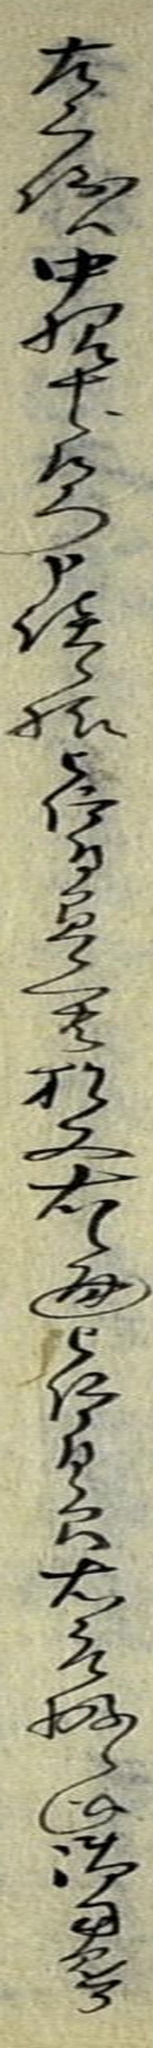左衛門儀は中根十郎左衛門申談候様被仰付置候へ共猶又右之通被仰付候間右取扱候趣御用懸り
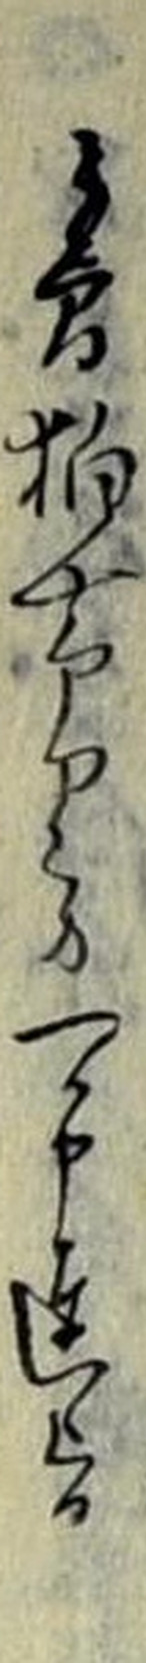了簡狛帯刀方可申達旨
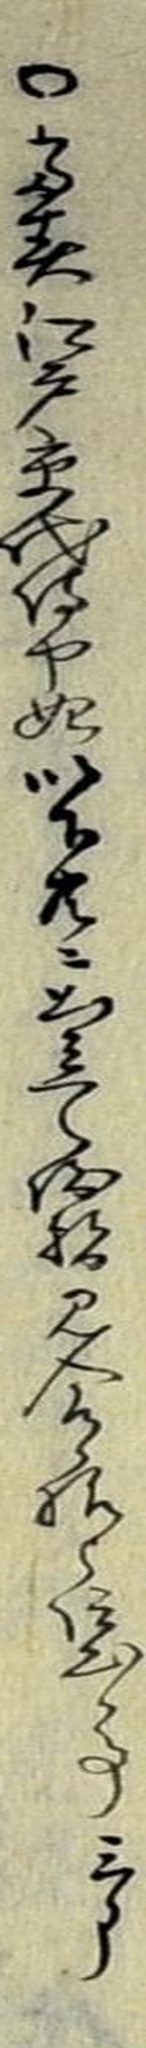〇当春江戸交代侍中始以下共に出立之儀指見合候様被仰出候事三月
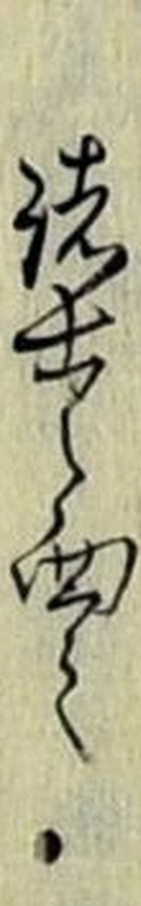諸士之面々
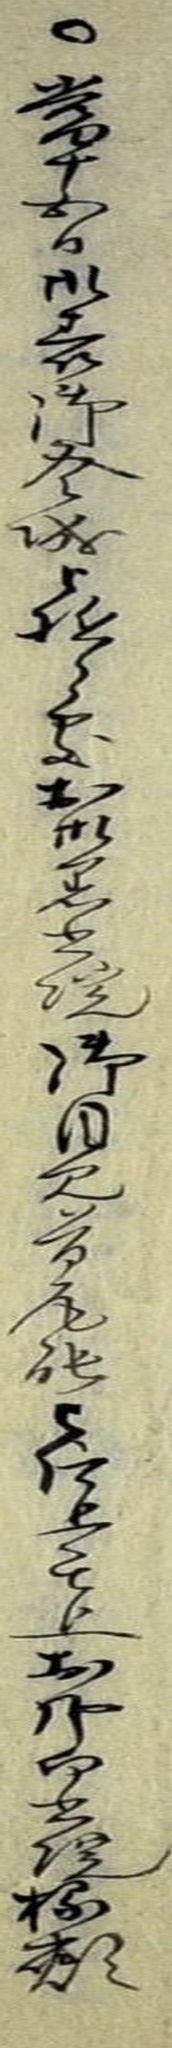〇当十五日御表御登城被遊候処於御黒書院御目見首尾能被仰上其上於御白書院縁頬
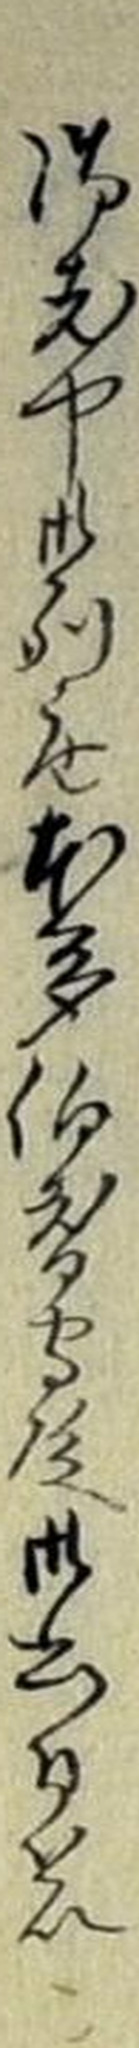御老中御列座本多伯耆守殿御書付を以
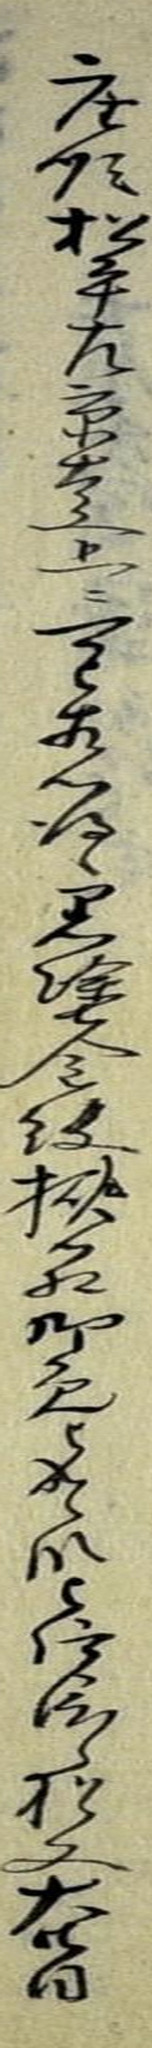座順松平左京太夫上に可被相心得候黒塗金紋挟箱御免被成候段被仰渡候猶又大御目
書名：命令之部 二
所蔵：福井県文書館 Fukui Prefectural Archives
